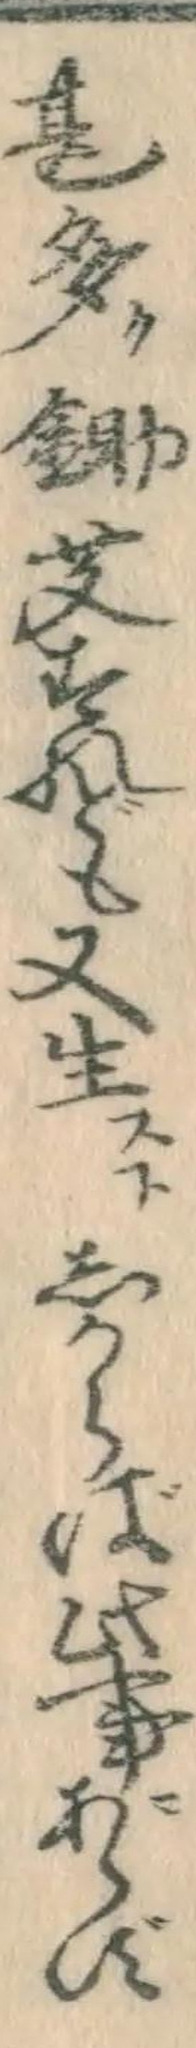甚多く鋤花すれども又生すとしからば此事にあらず
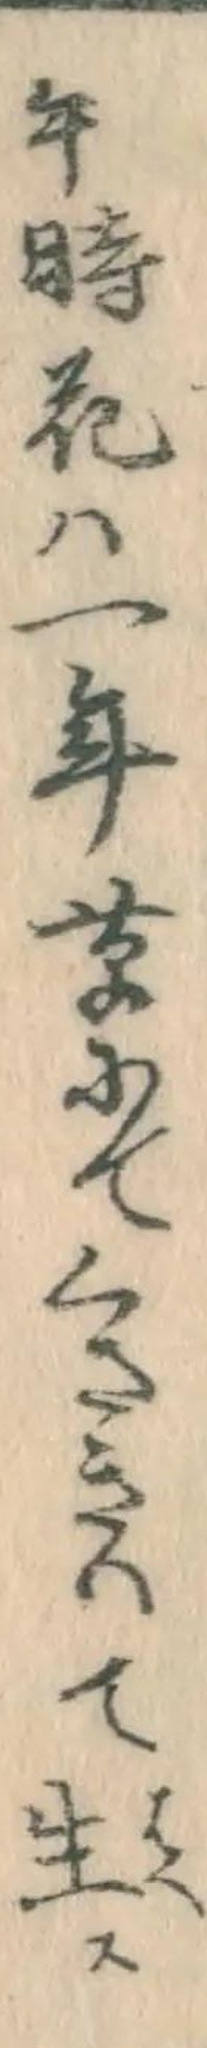午時花は一年草にてくさきりて生す

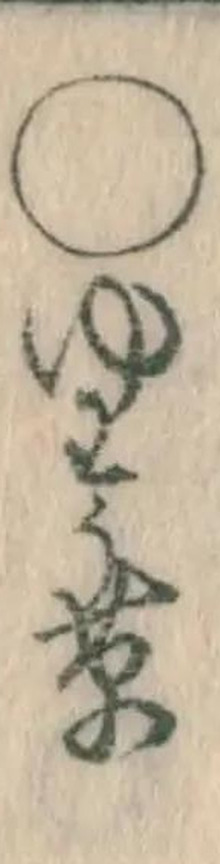〇ゆわう草
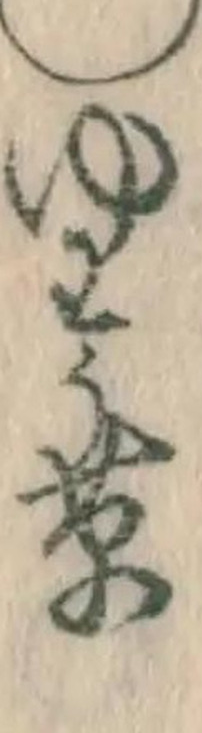〇ゆわう草
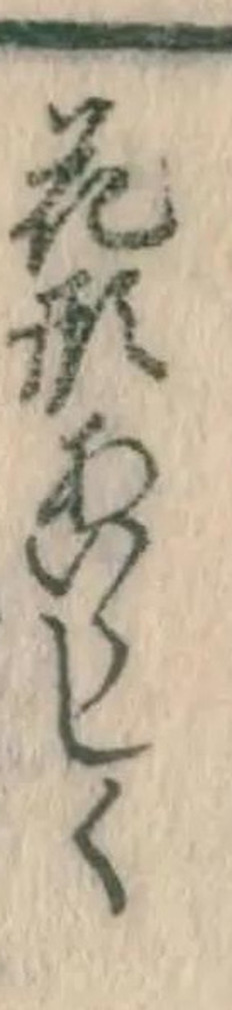花形あいらしく
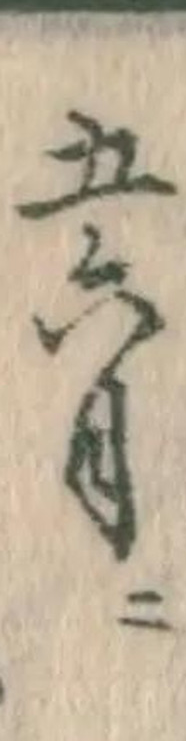五六月に
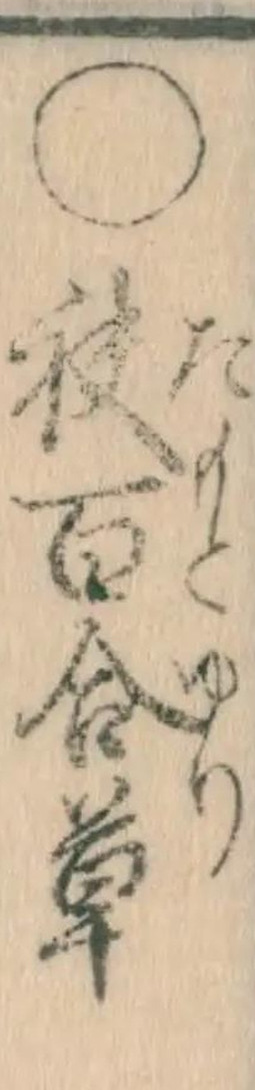〇袂百合草
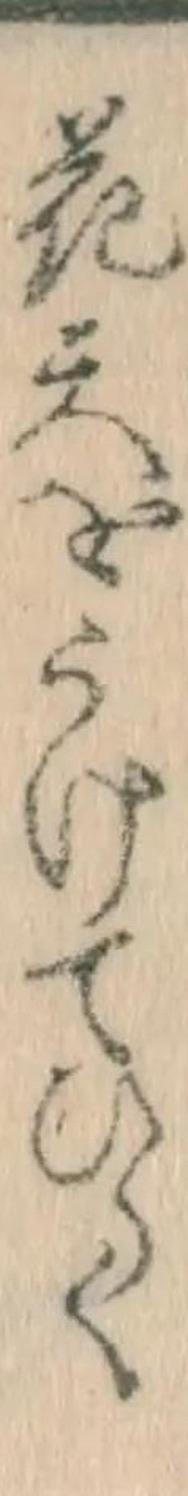花天をうけてひらく
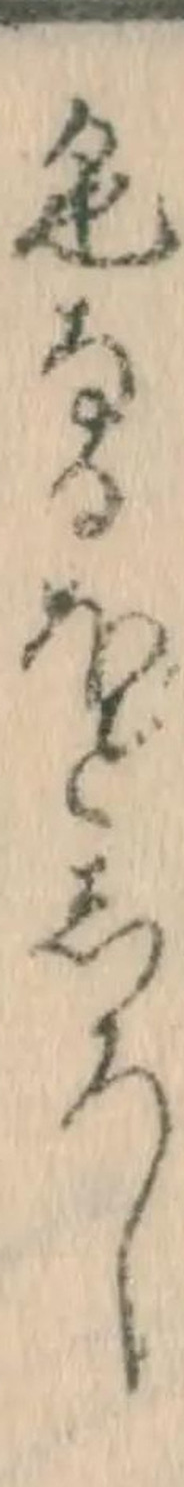色なるほどしろく
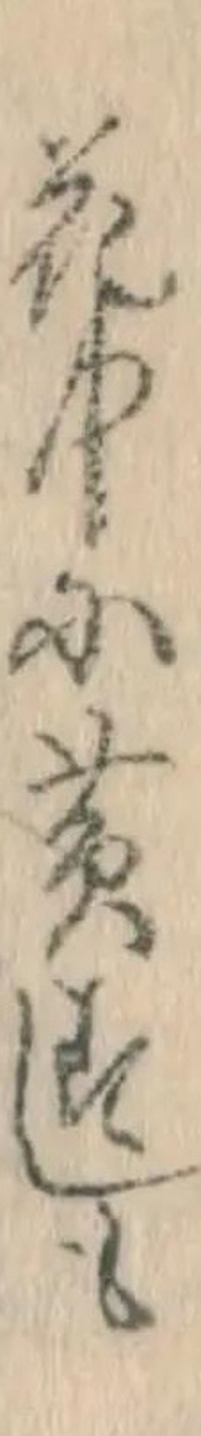花中に黄すしも
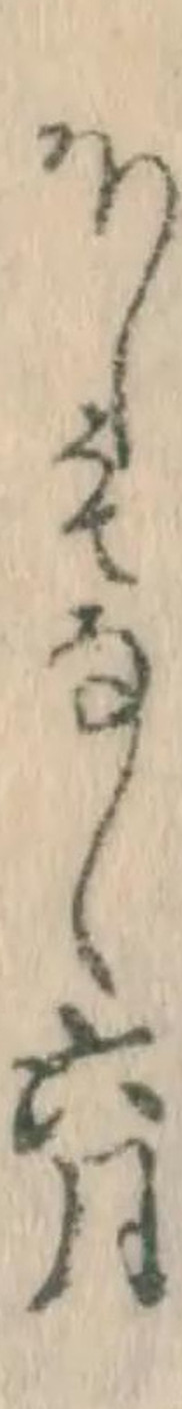ほしもなし六月
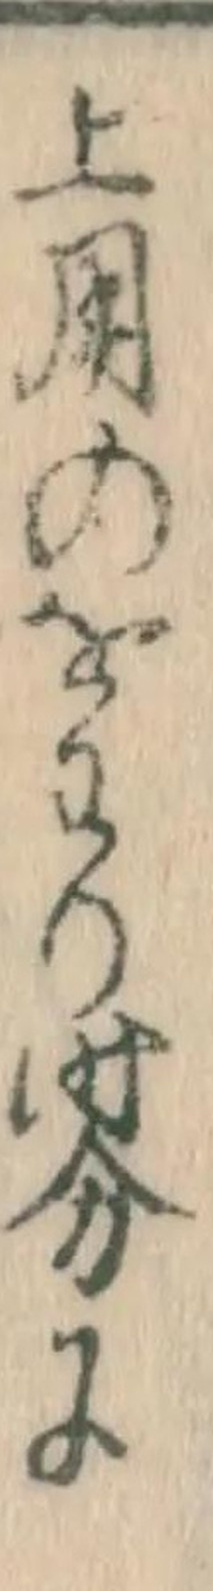上用のをわり時分に
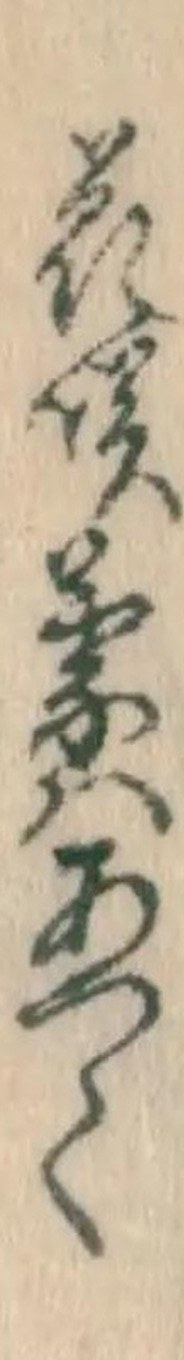花咲葉はあつく
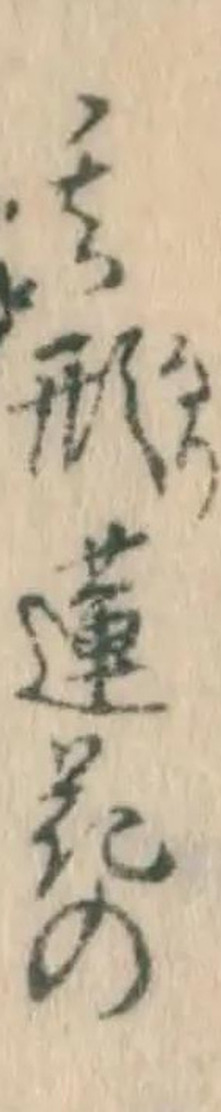其形蓮花の
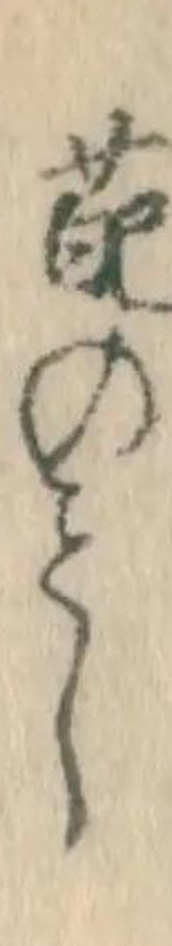葩のことく

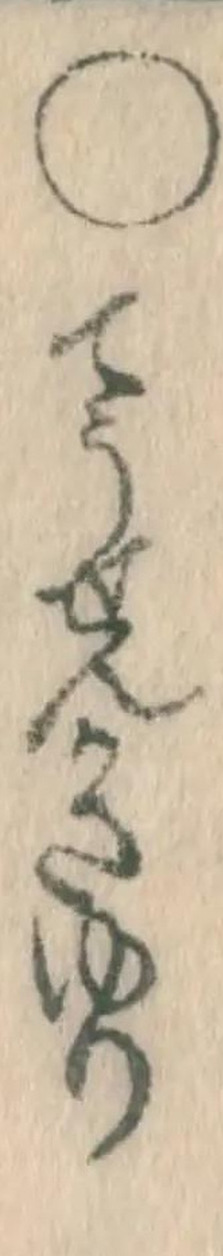〇てうせんかさゆり
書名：艸花繪前集. [3]
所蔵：国立国会図書館 National Diet Library, JAPAN
